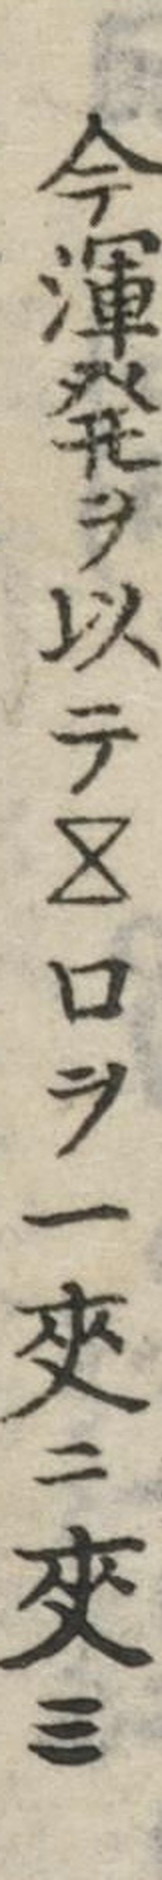今渾発ヲ以テ▽△ヲ一夾ニ夾ミ
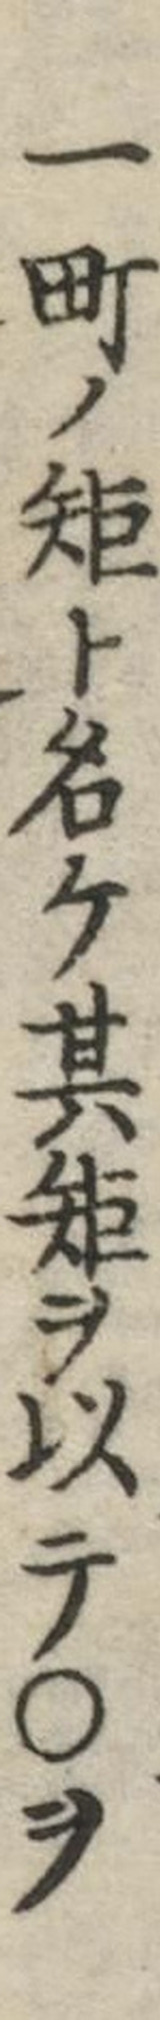一町ノ矩ト名ケ其矩ヲ以テ○ヲ
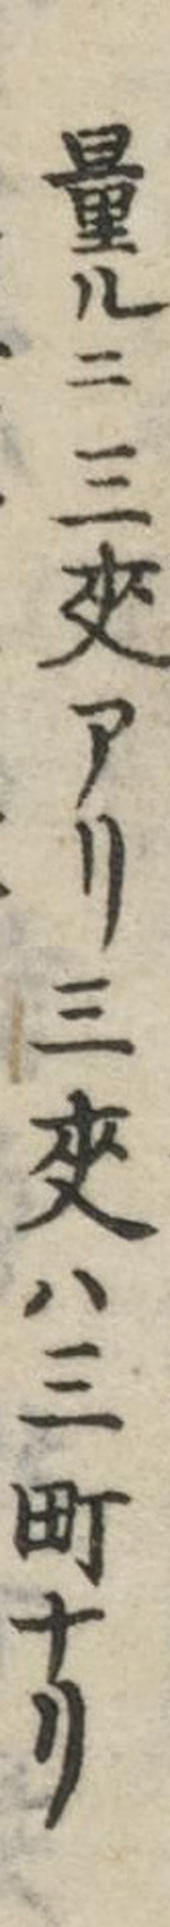量ルニ三夾アリ三夾ハ三町ナリ
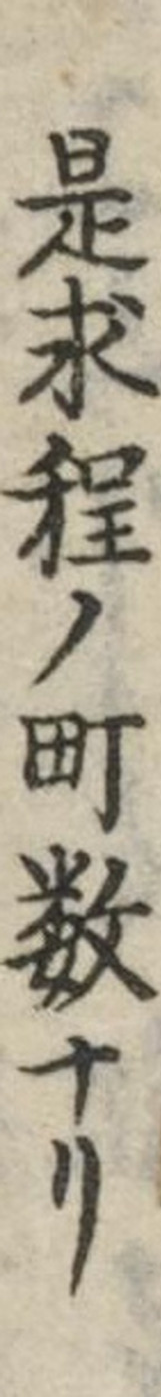是求程ノ町数ナリ
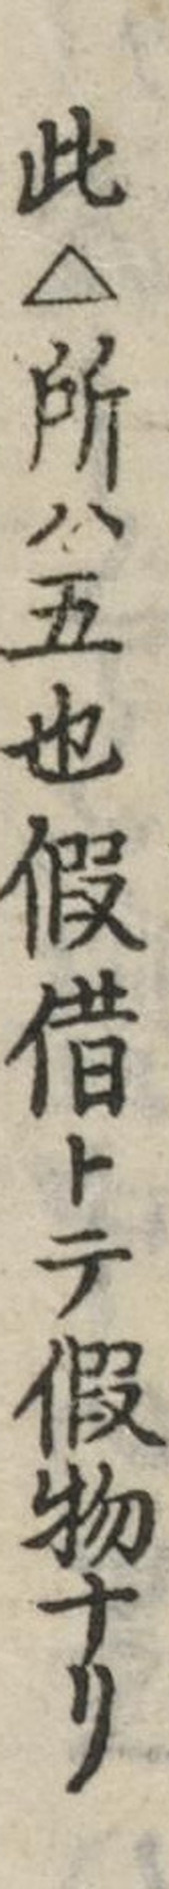此△所ハ五也仮借トテ仮物ナリ
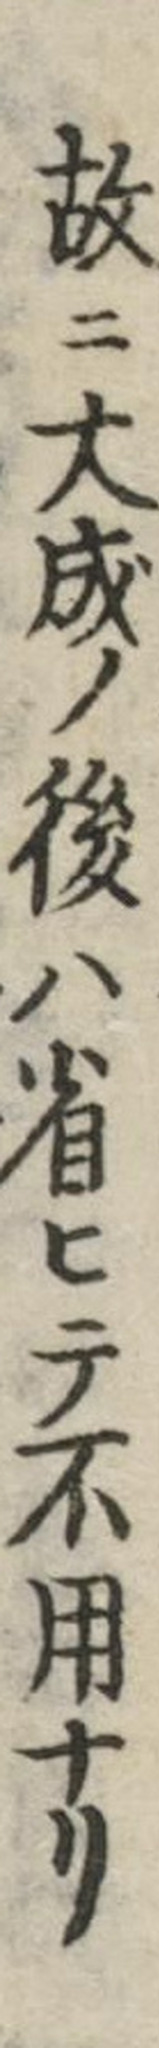故ニ大成ノ後ハ省ヒテ不用ナリ
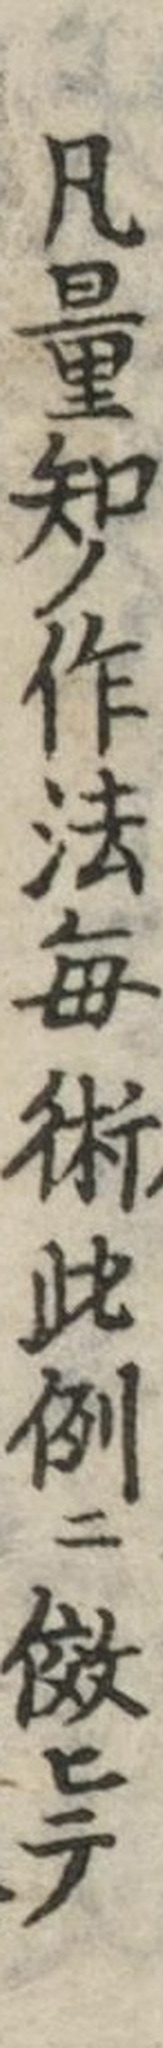凡量知ノ作法毎術比例ニ倣ヒテ
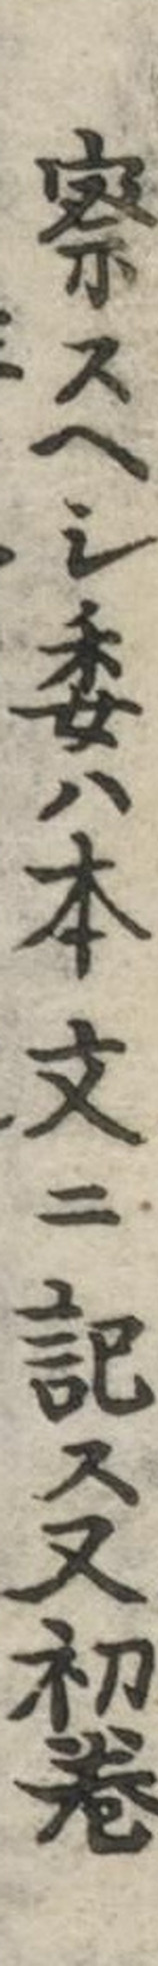察スヘシ委ハ本文ニ記ス又初巻
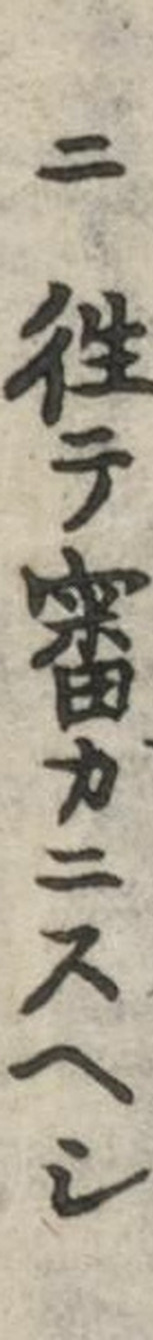ニ往テ審カニスヘシ
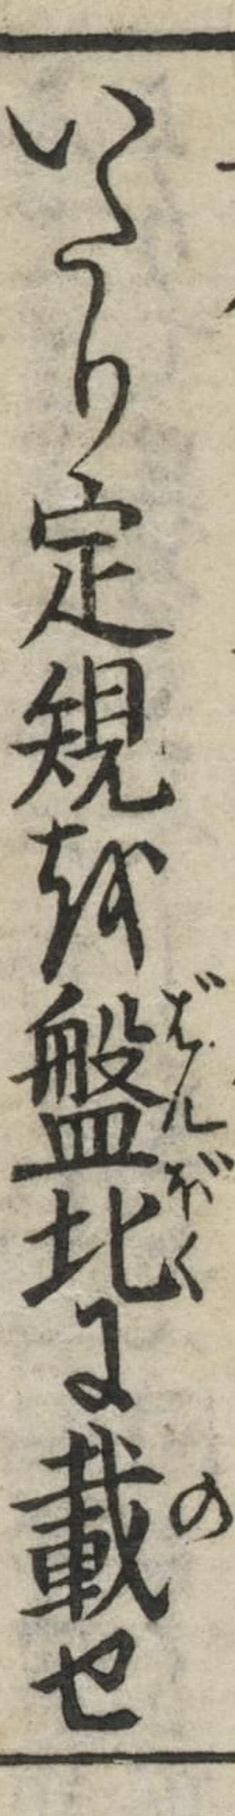いたり定規を盤北に載せ
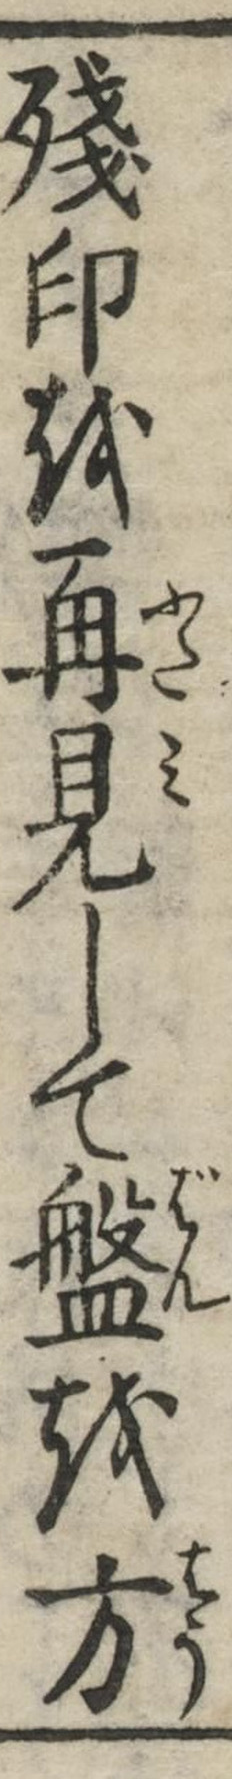残印を再見して盤を方

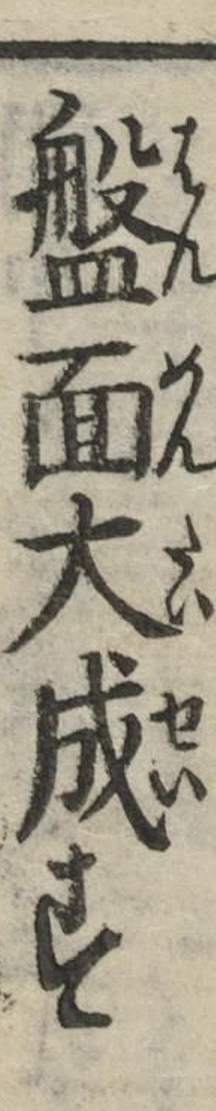盤面大成す
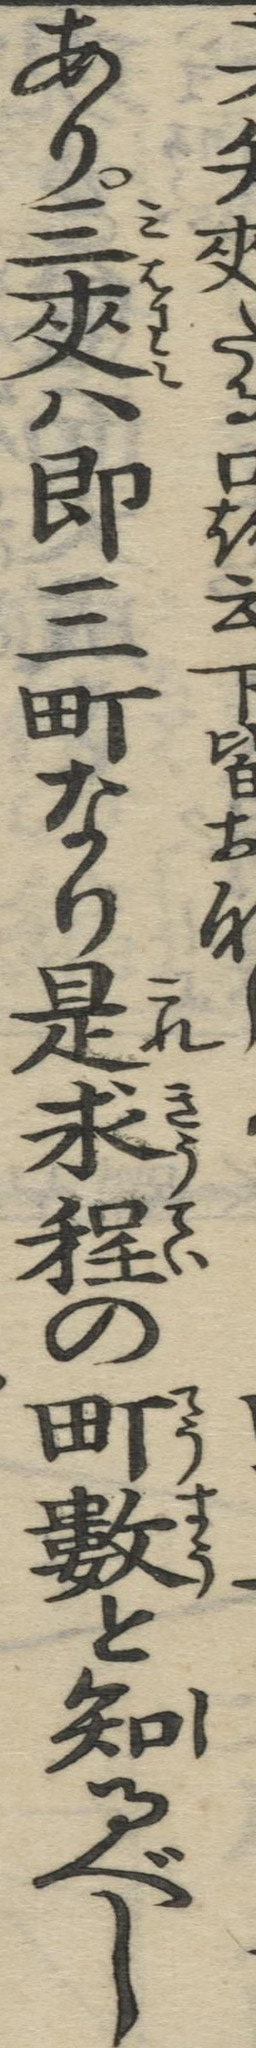あり。三夾は即三町なり是求程の町数と知るべし
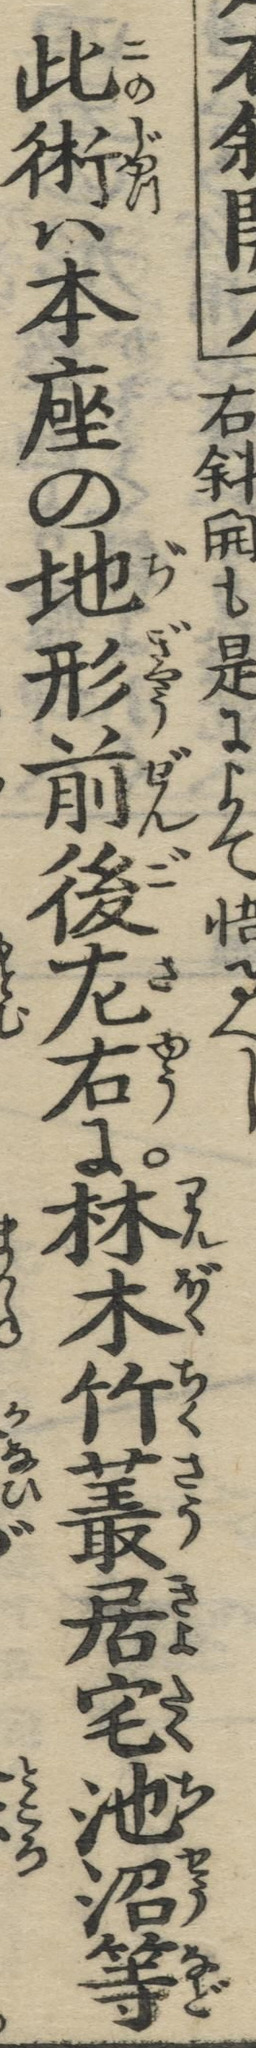此の術は本座の地形前後左右に。林木竹叢居宅池沼等
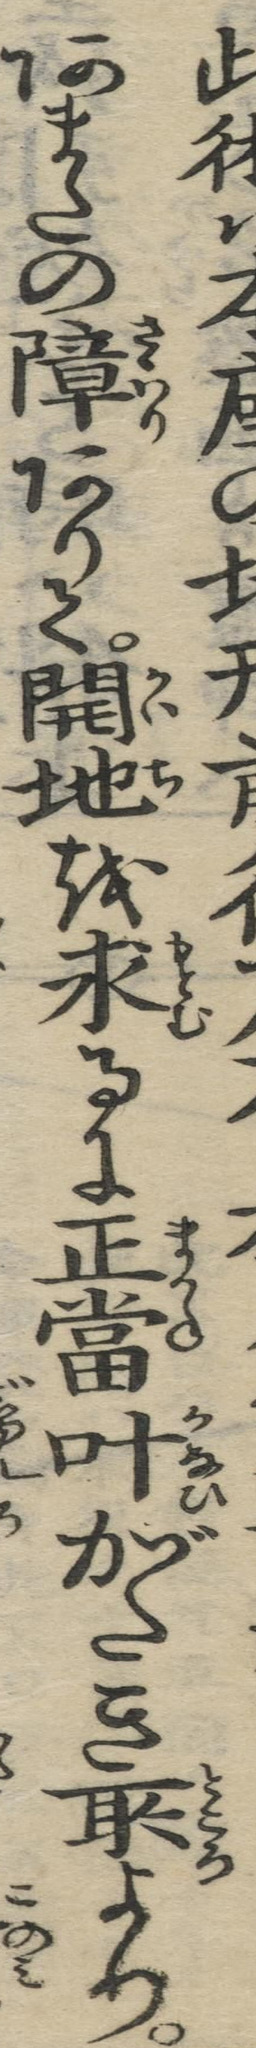あまたの障ありて。開地を求るに正当叶がたき所より。
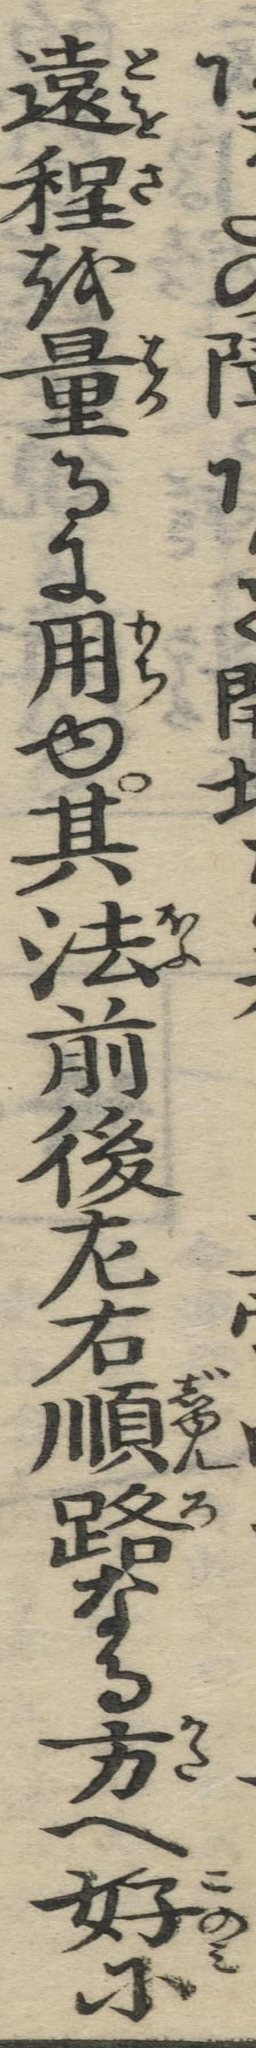遠程を量るに用ゆ。其法前後左右順路なる方へ好に
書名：量地指南　巻之二（内題）
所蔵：東京大学地震研究所図書室 Earthquake Research Institute Library, The University of Tokyo, JAPAN
